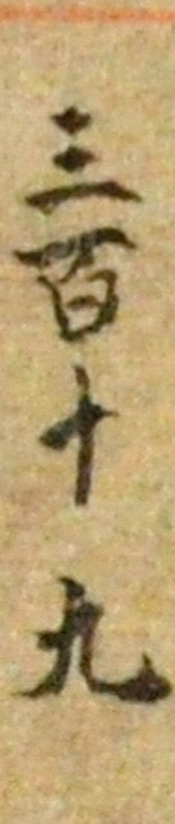三百十九
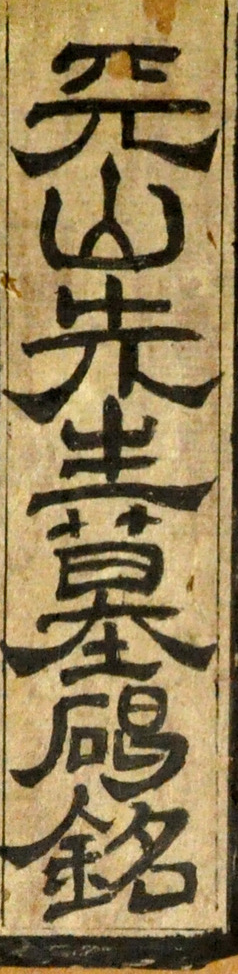天山先生墓碣銘

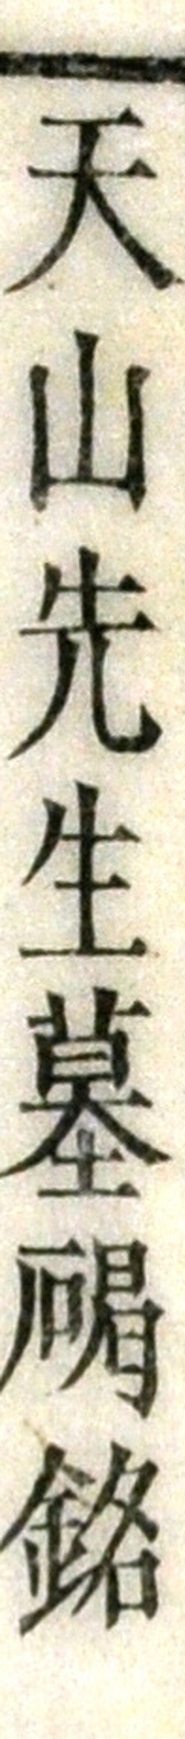天山先生墓碣銘
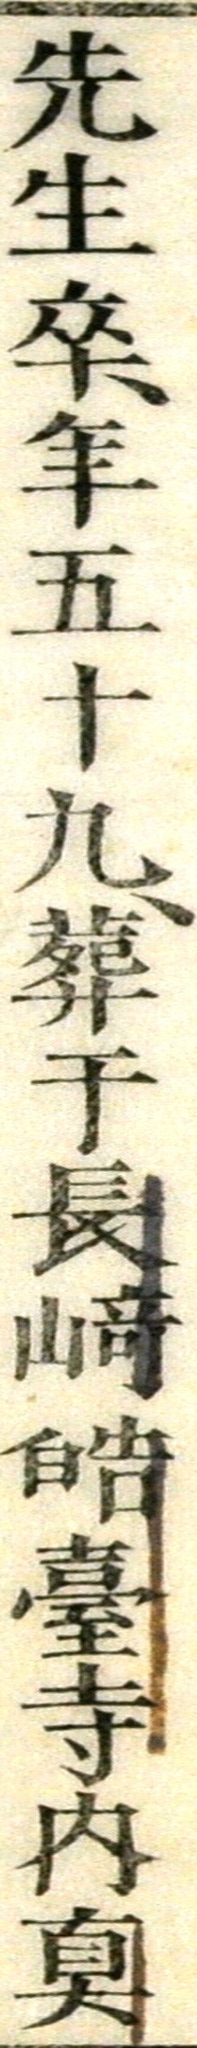先生卒、年五十九、葬于長崎晧台寺内真
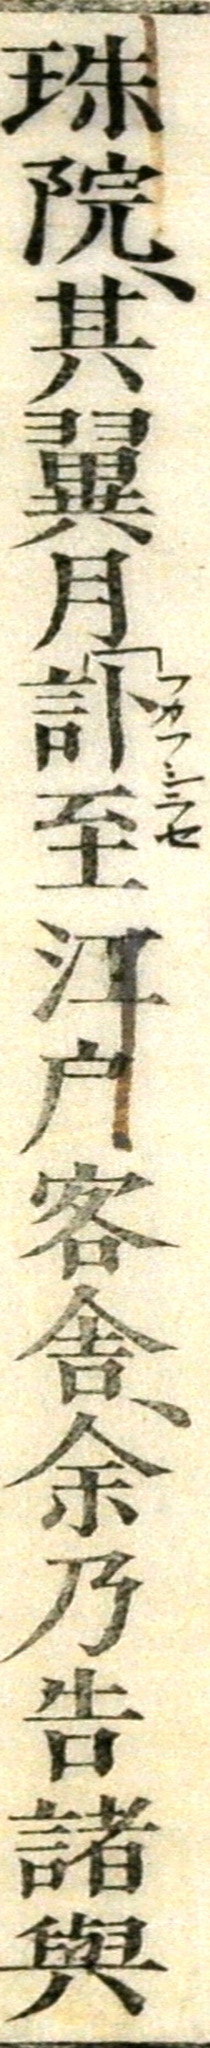珠院、其翌月訃至江戸客舎、余乃告諸興
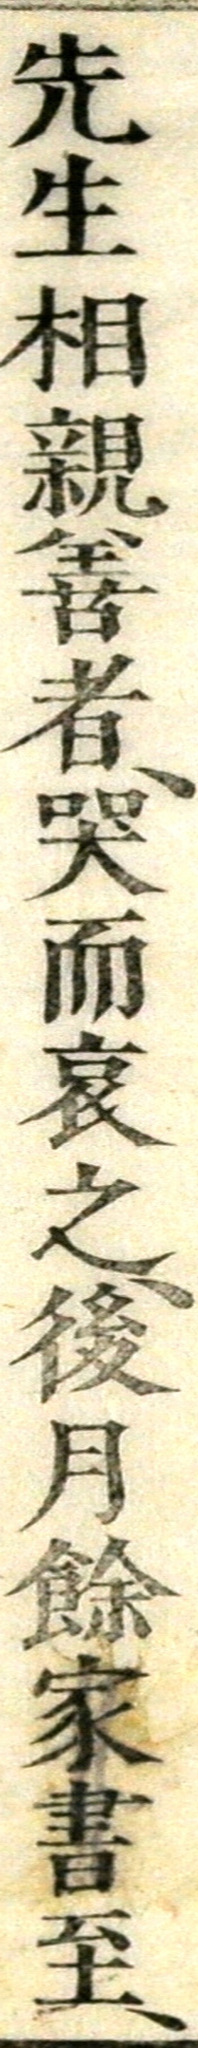先生相親善者、哭而哀之、後月餘家書至、
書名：天山先生墓碣銘
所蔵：伊那市立高遠町図書館・合同会社AMANE
